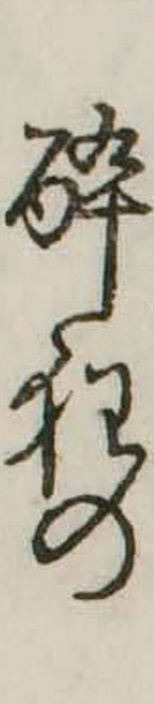酔狂の
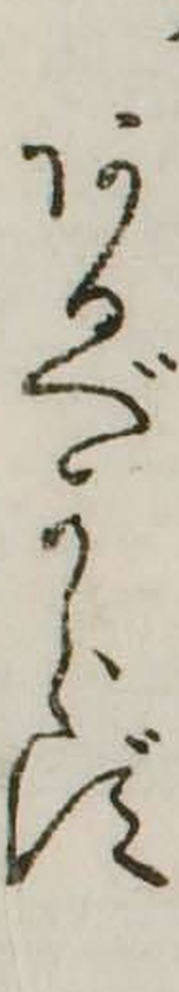あるべからず

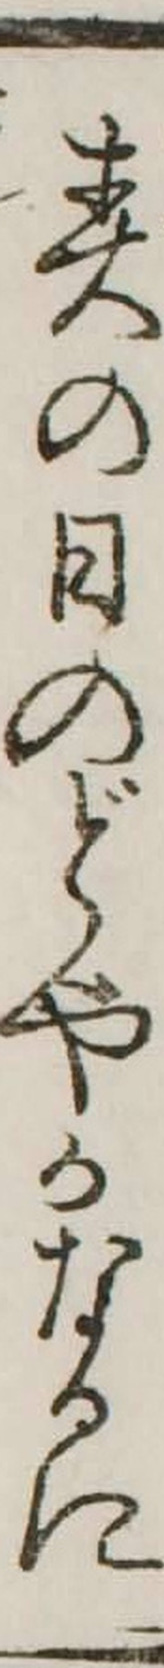春の日のどやかなるに
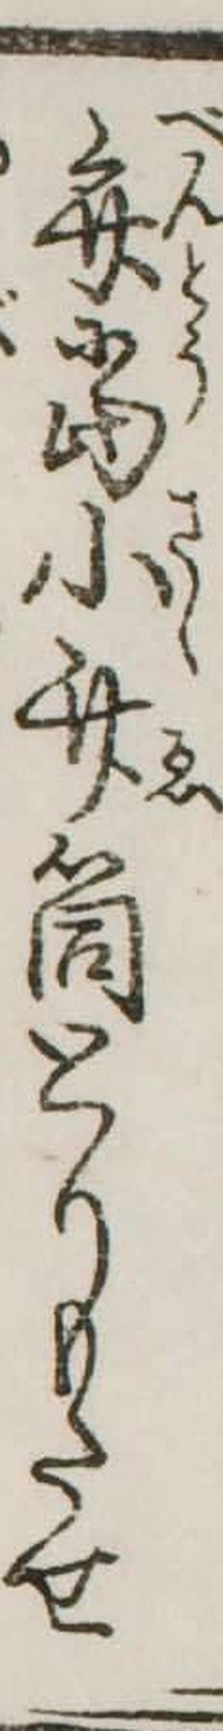弁当小竹筒とりもたせ
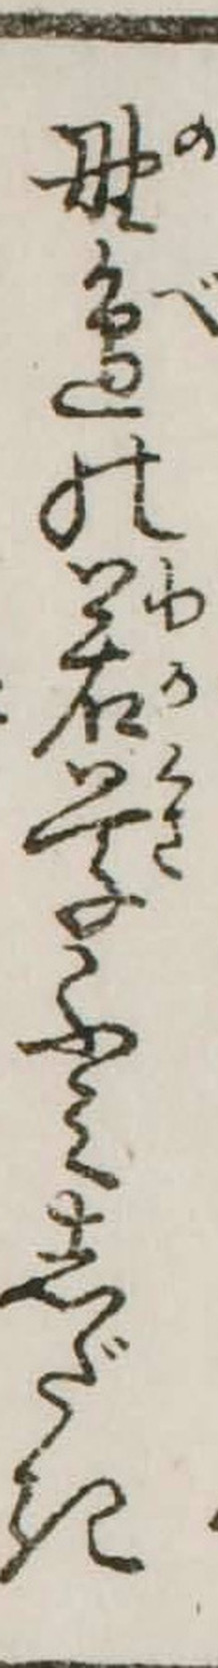野辺の若草ふみしだき
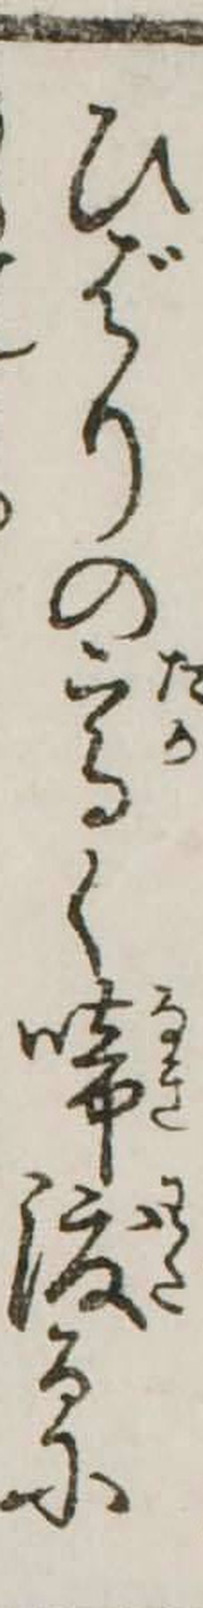ひばりの高く啼渡るに
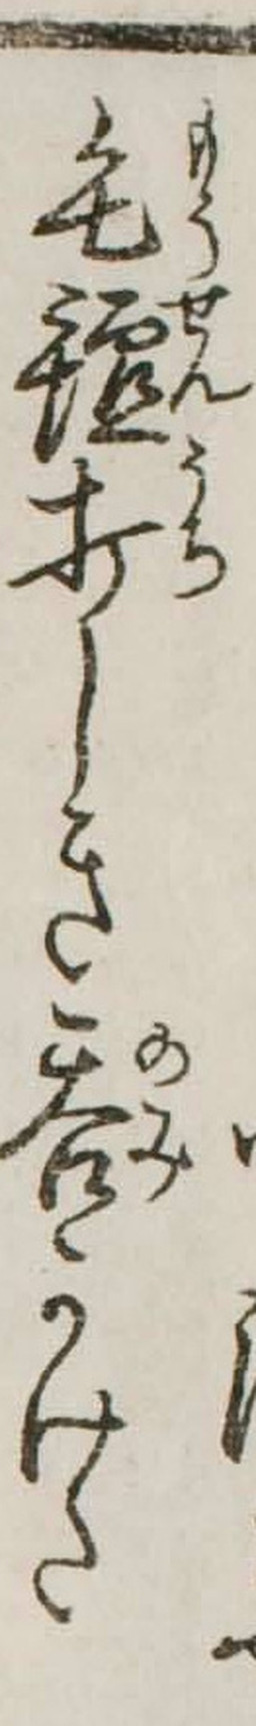毛氈打しき呑かけた
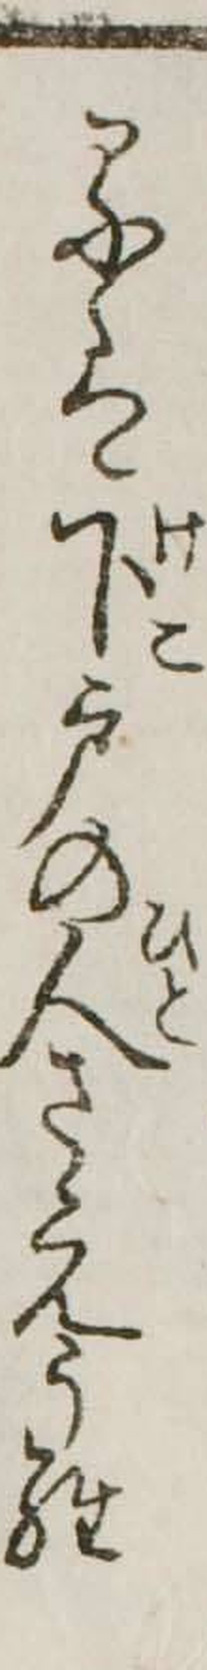るは下戸の人さえうら
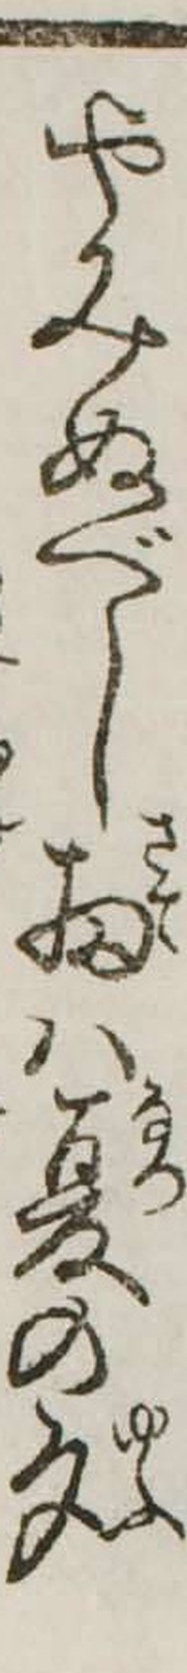やみぬべし扨は夏の夕
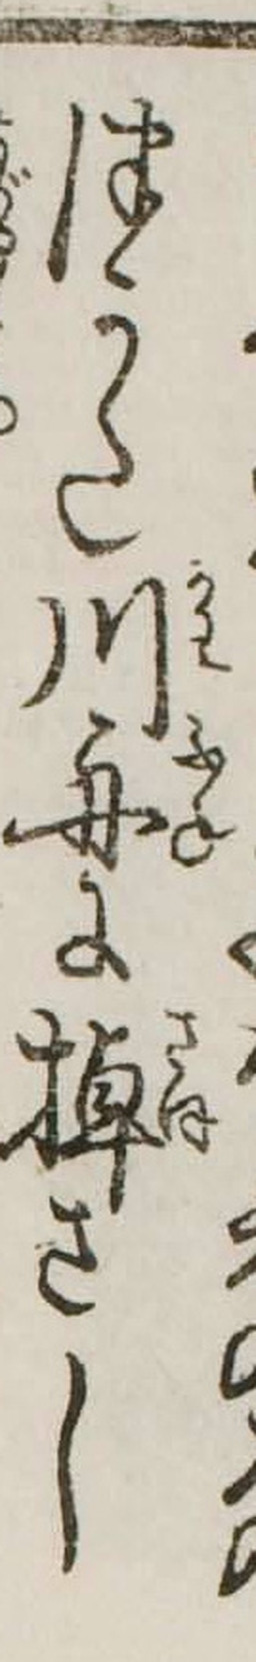つかた川舟に棹さし
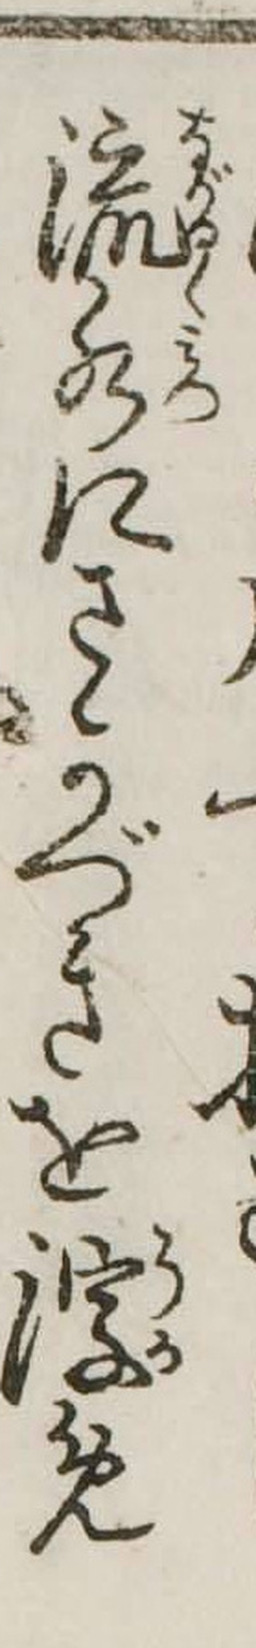流水にさかづきを浮め
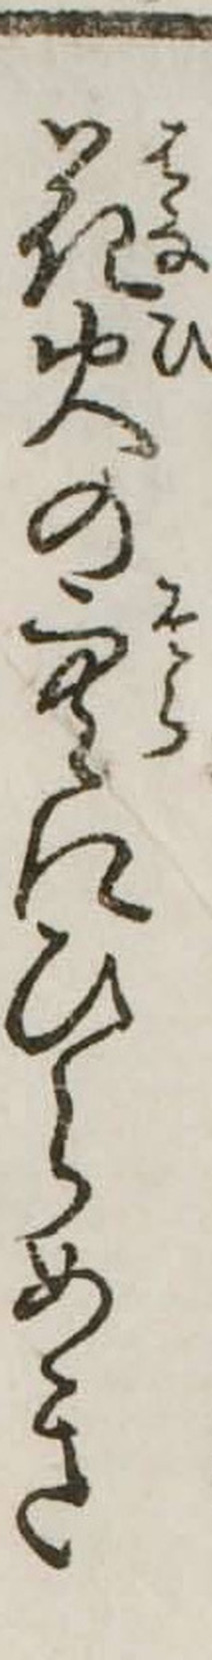花火の空にひらめき
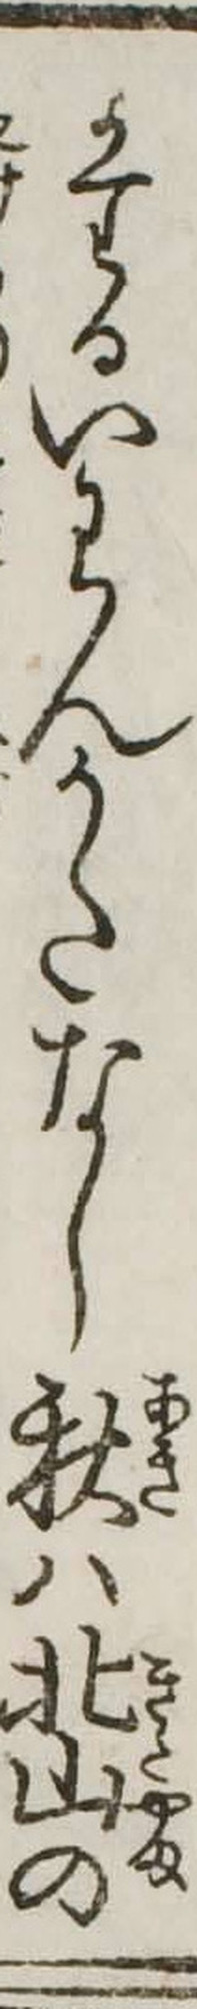たるいわんかたなし秋は北山の
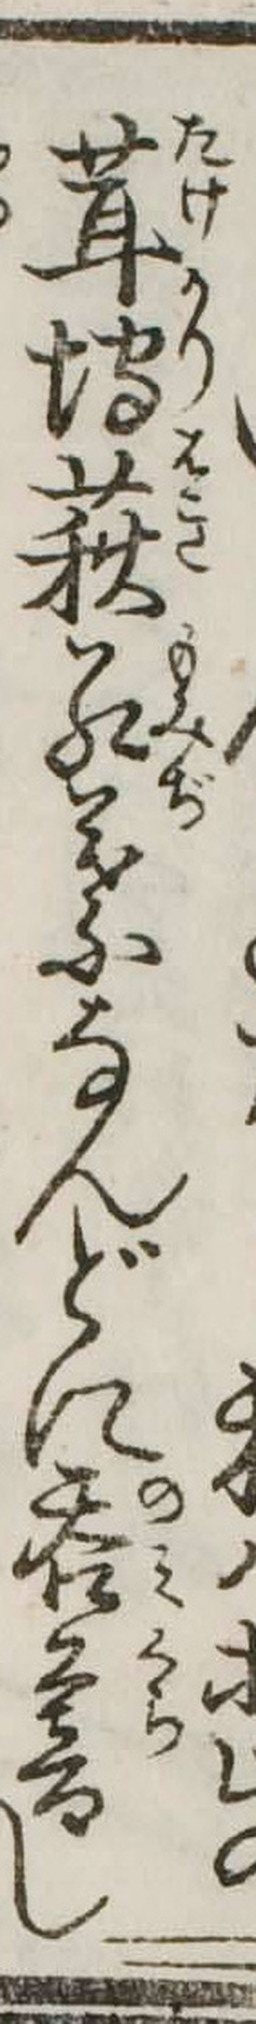茸狩萩紅葉なんどに呑暮し
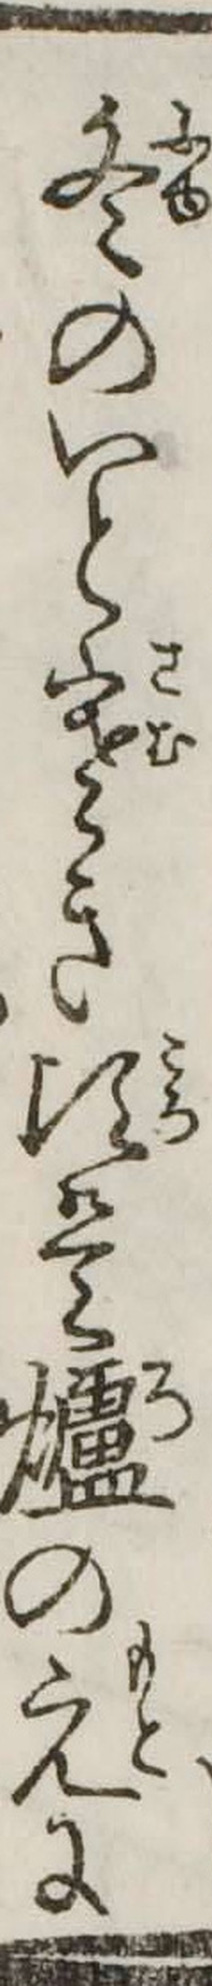冬のいと寒き頃は炉の元に
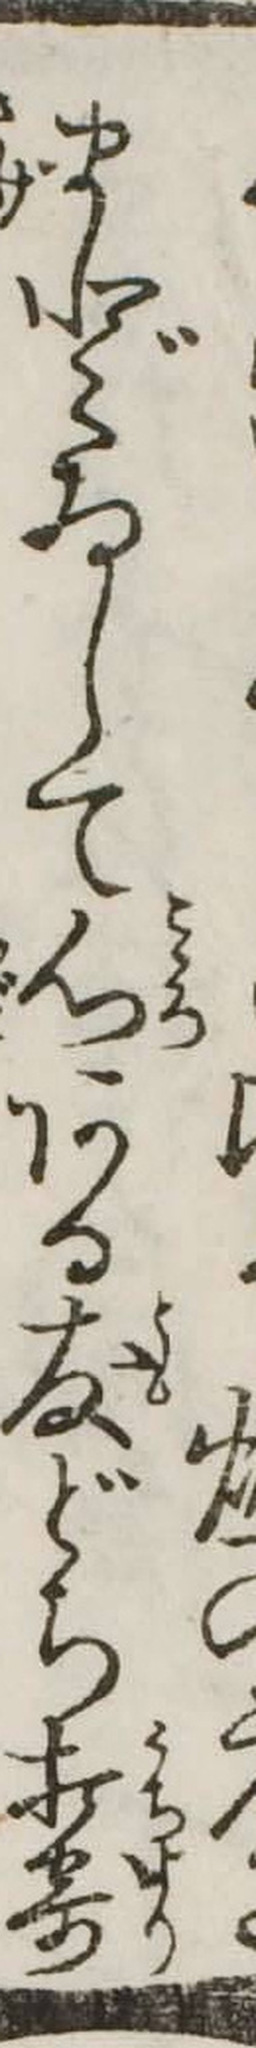まどゐして心ある友どち打寄
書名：繪本不盡泉
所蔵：国文学研究資料館
